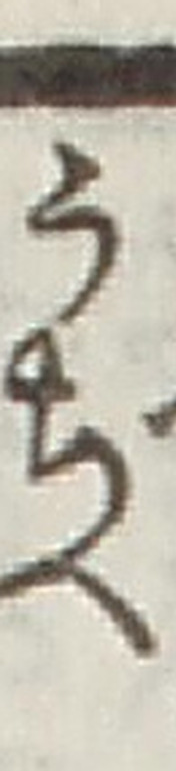うちへ
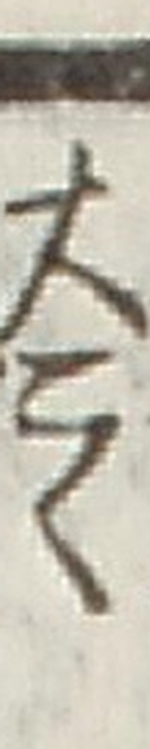大こく
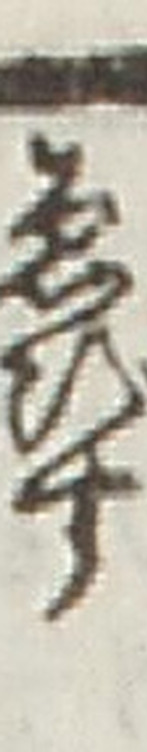えびす
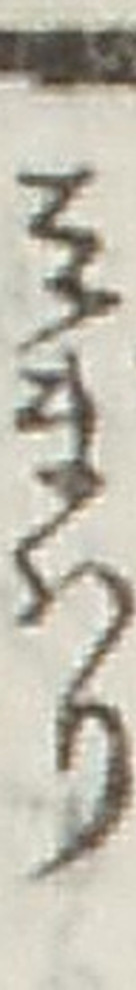みまはり
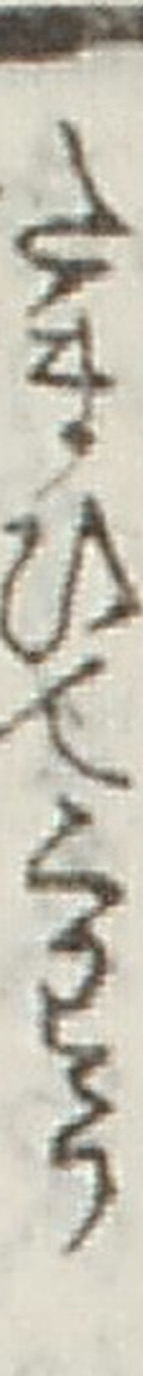たまひてくわう
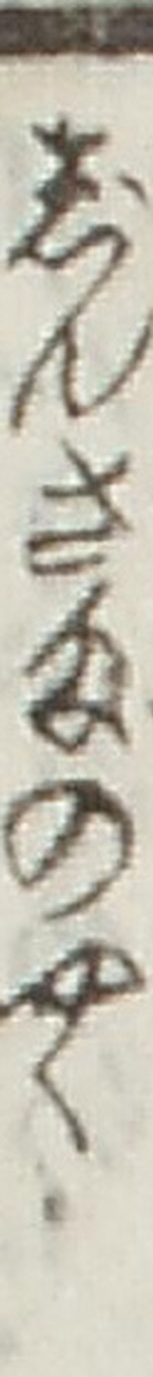じんさまのやく
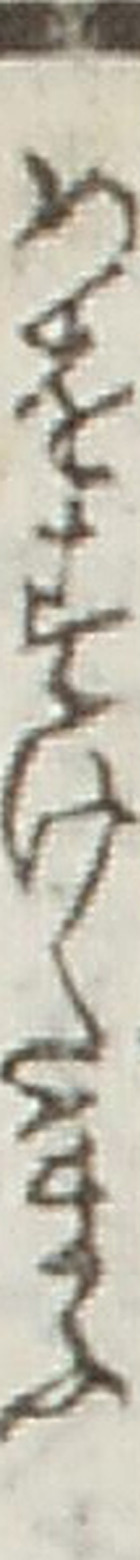めをすけたまふ
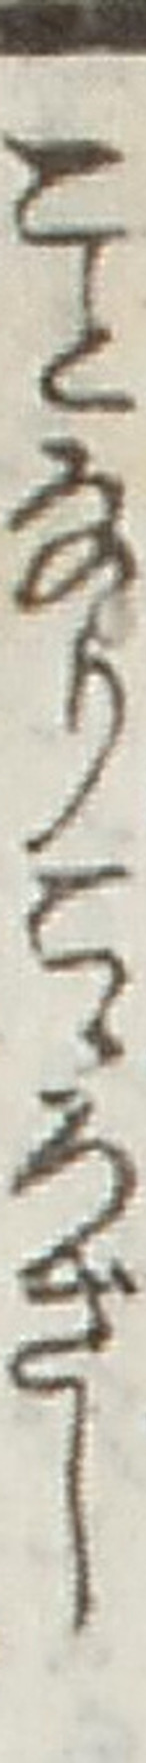ことなりこゝろざし
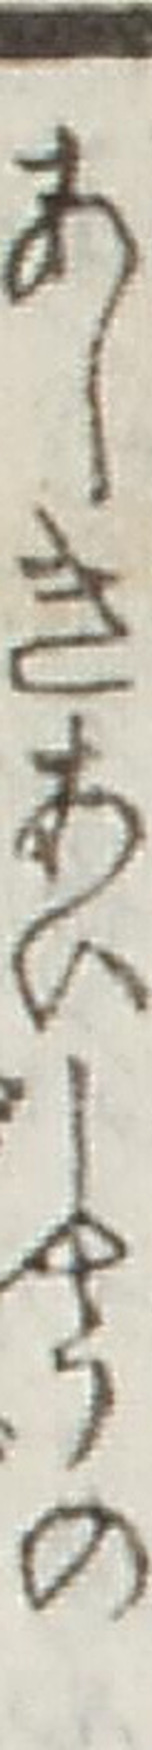あしきあいしやうの
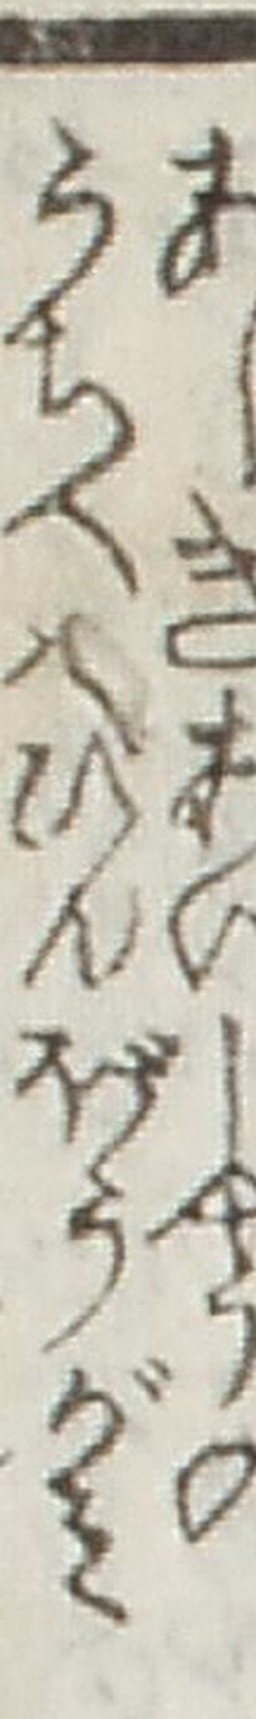うちへは？びんぼうがみ
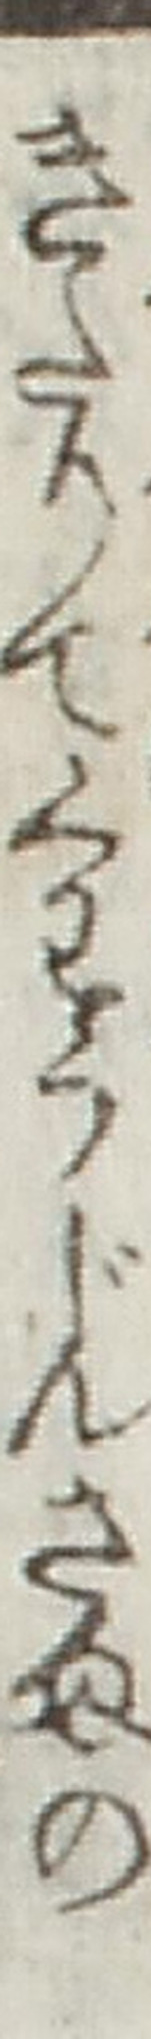きたりてくわうじんさまの
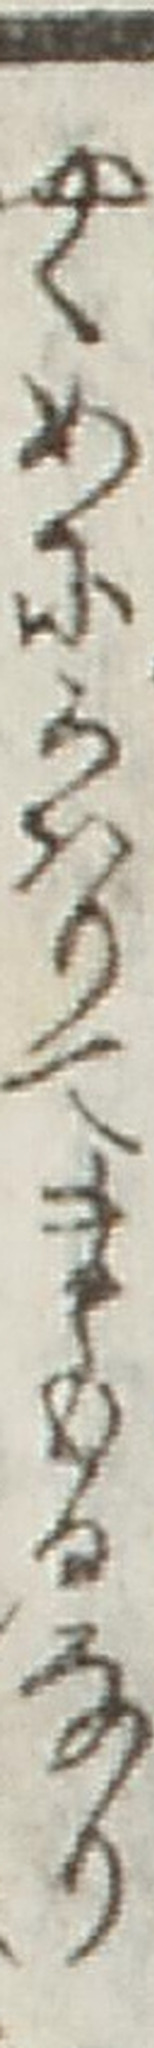やくめにかはりてまもるなり
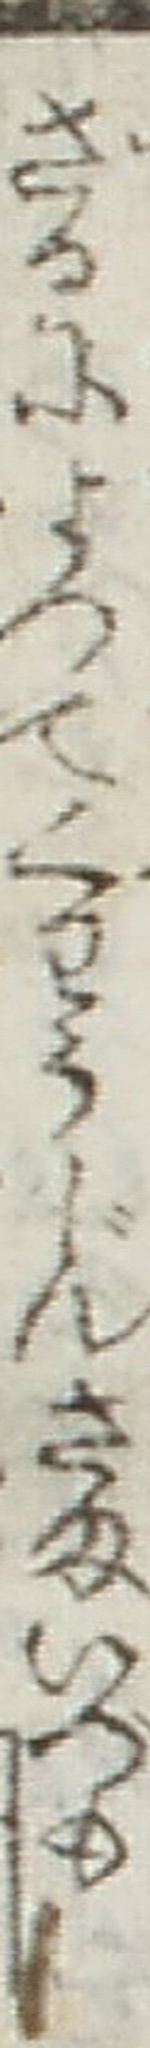さるによつてくわうじんさまいづも
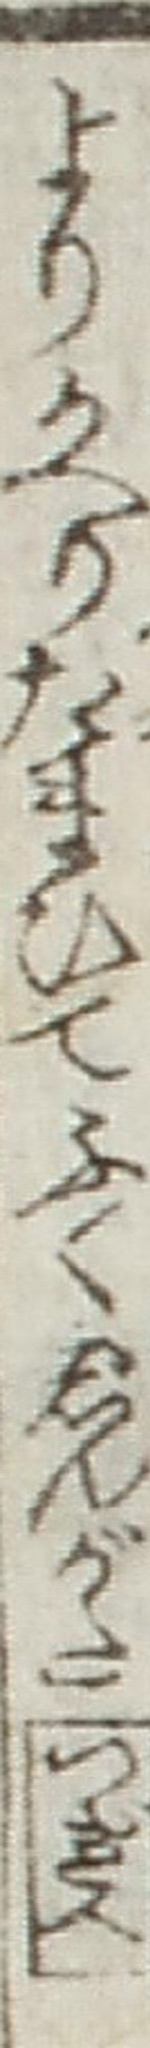よりかへりたまひてふくぢんがたつぎへ

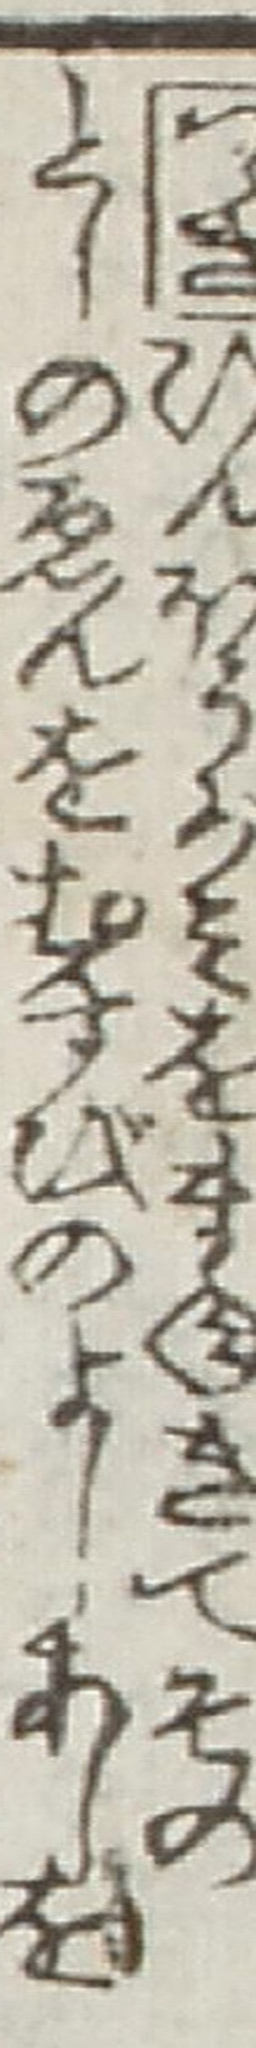としのゑんをむすびのよしあしを
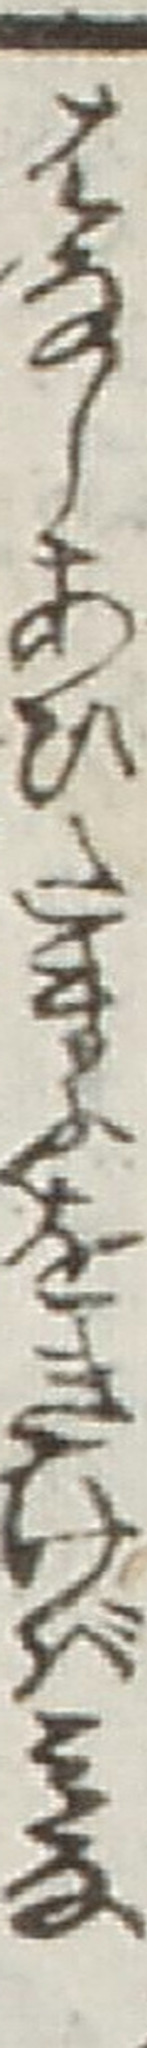はなしあひたまふをきけばみな
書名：三世相出雲當座帳　上下冊
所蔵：東京大学地震研究所図書室 Earthquake Research Institute Library, The University of Tokyo, JAPAN
